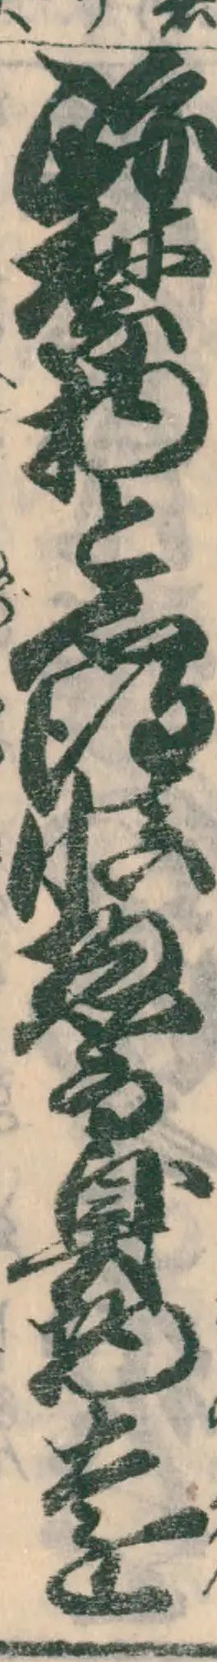跡禁物と心得慎惣而臭物遠
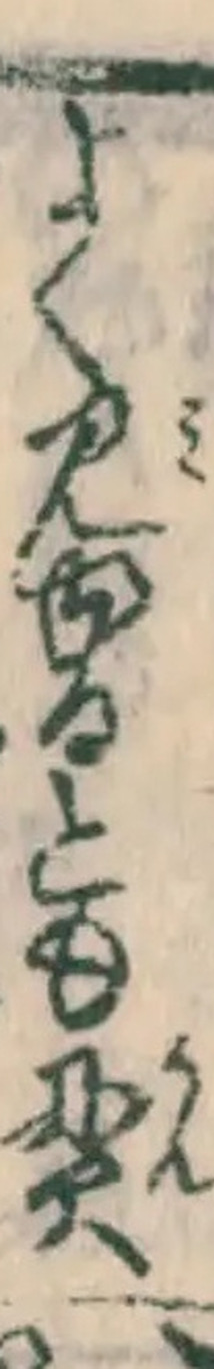よく見ゆるとも貫
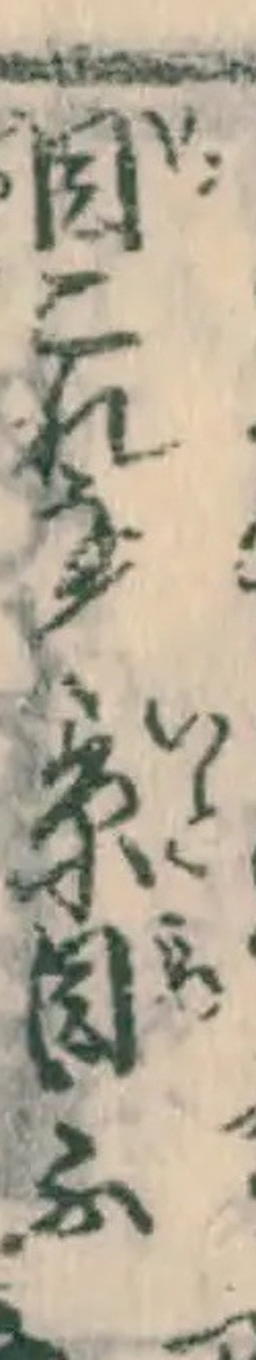目これなく糸目不
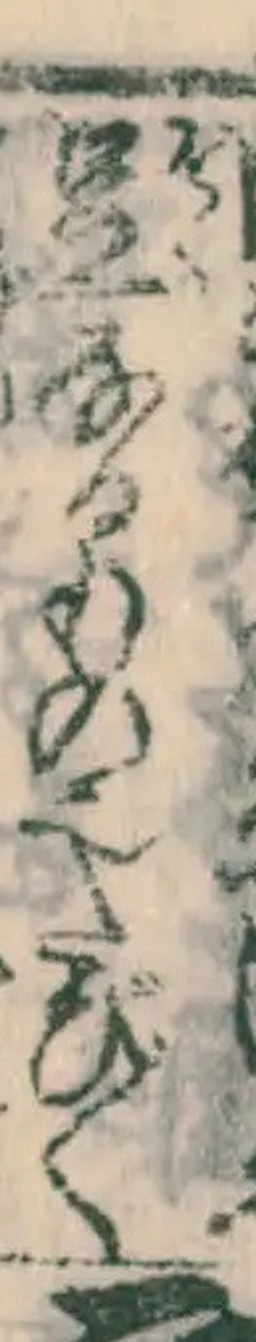足なるもの也たび〳〵
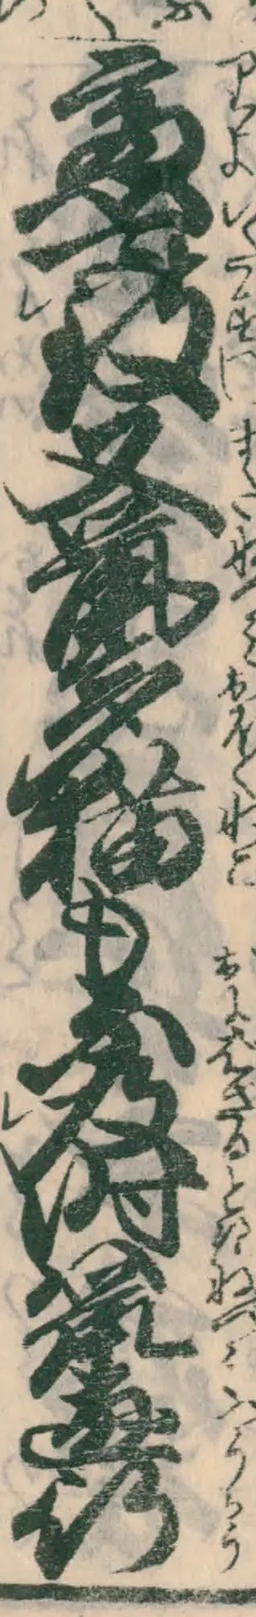慮可致又鼠多猫も不及時は鼠通行
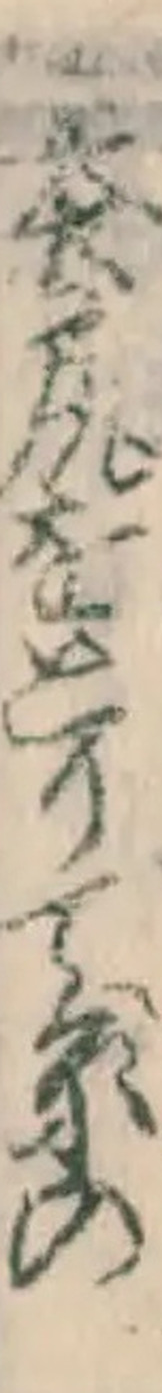蚕尻をとりて糸の
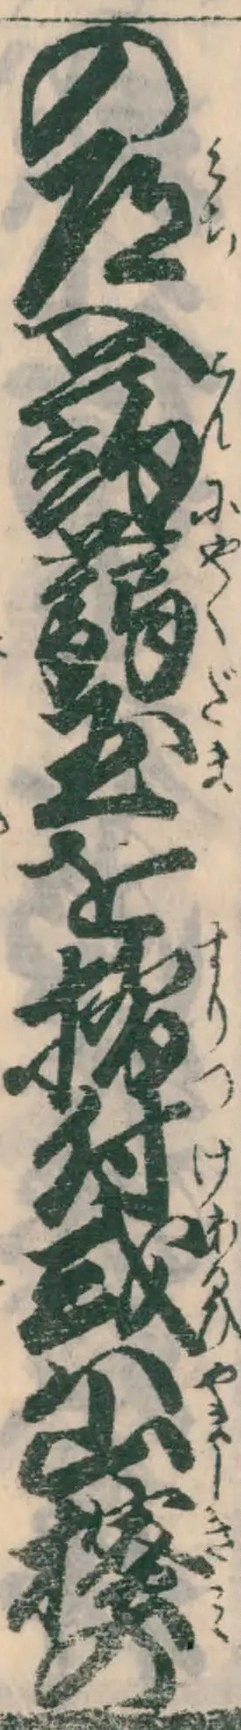の道へ蒟蒻玉を摺付或は山樒の
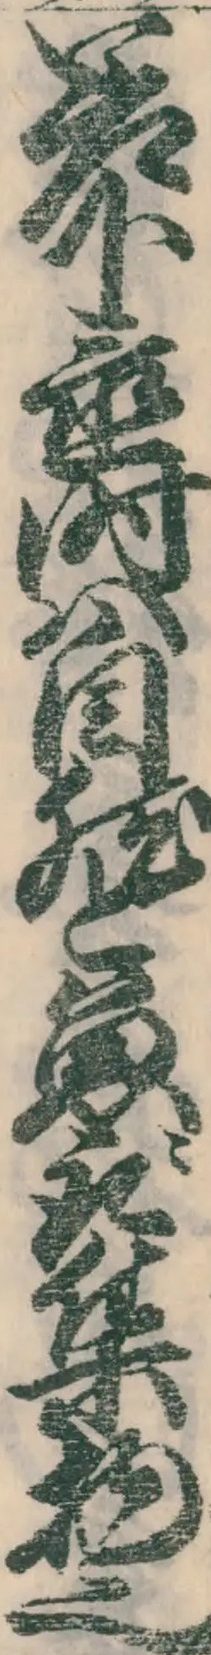差下置時は自然と魚に取集物也
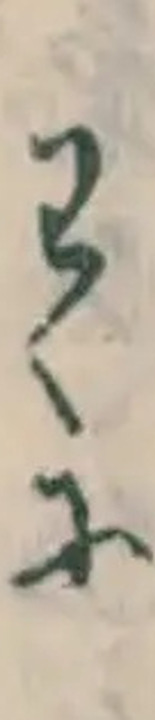わくに
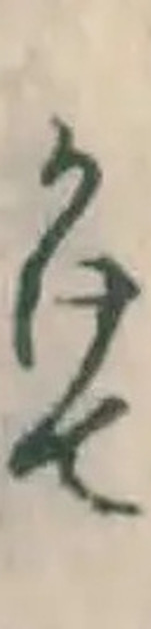かけて
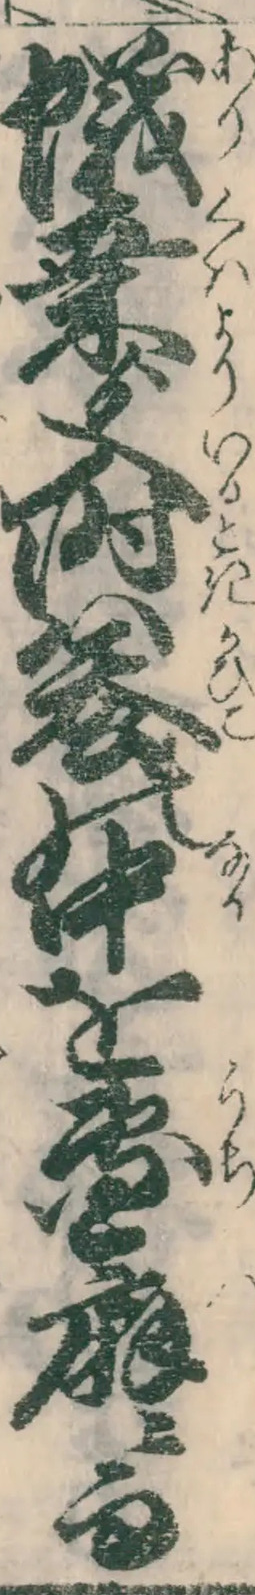蟻桑より入時は蚕の中を団扇にて
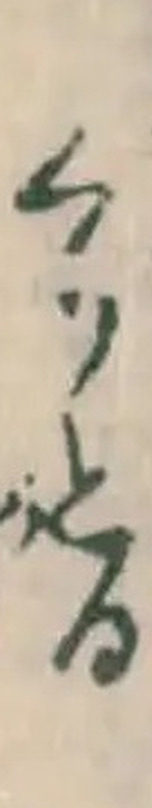くりとる
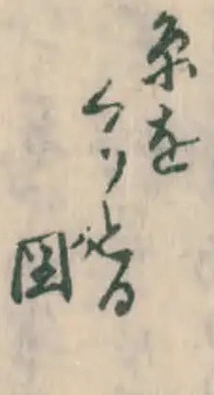くりとる
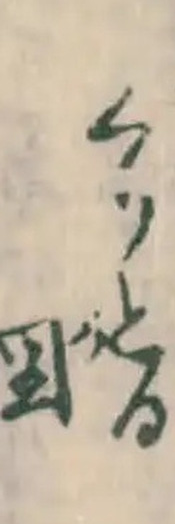くりとる

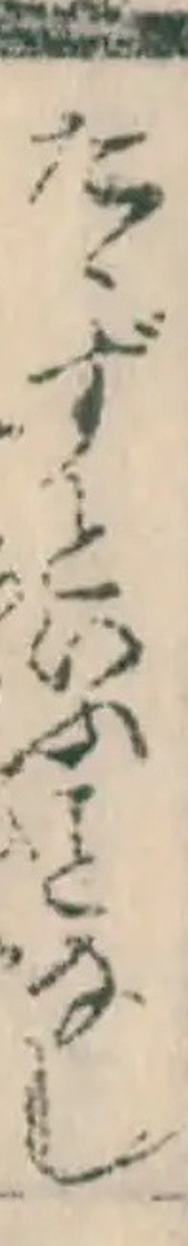たゝずといふことなし
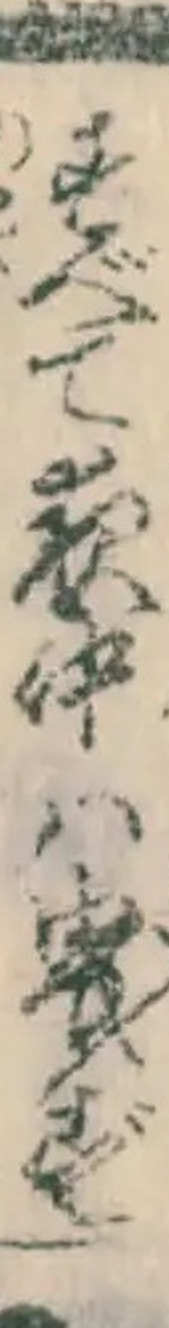すべて夜中は曳ず
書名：養蚕往来
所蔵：国立国会図書館 National Diet Library, JAPAN
